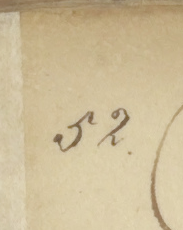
52.
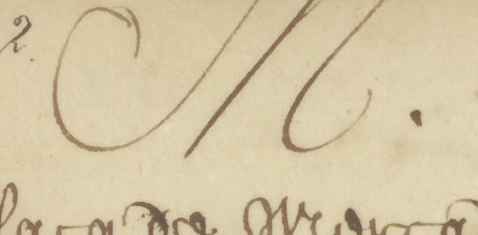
M.
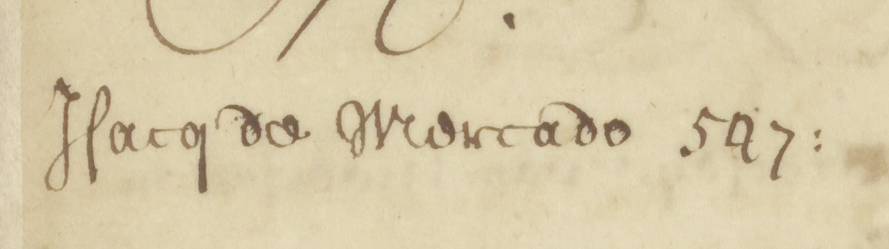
Isacq de Mercado 547:
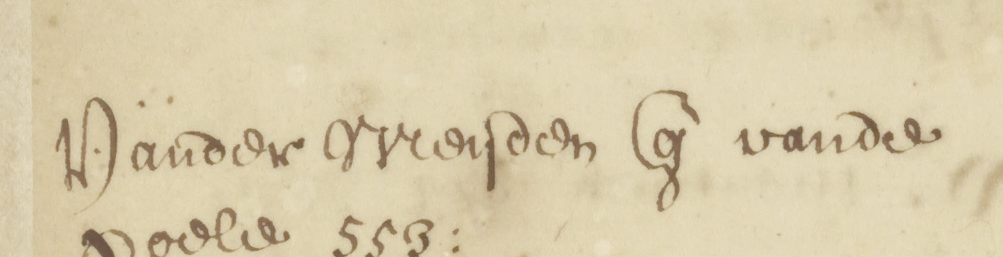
Vander Meisden Ca. vande
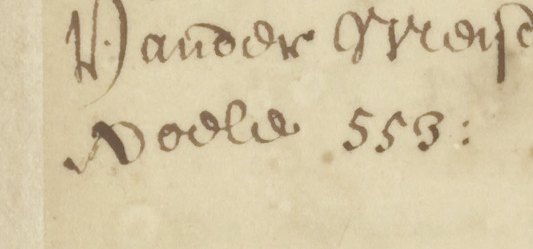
Poele 553:
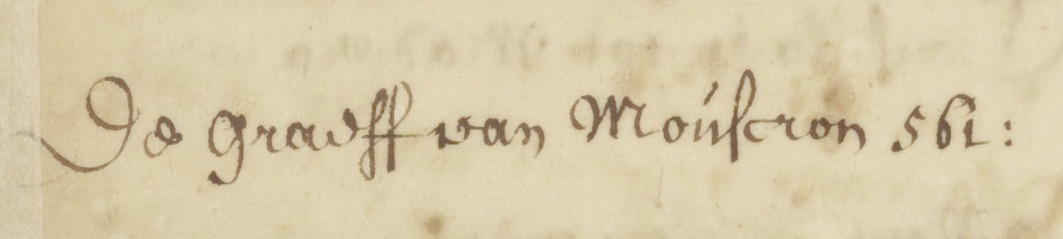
De Graeff van Mouscron 561:
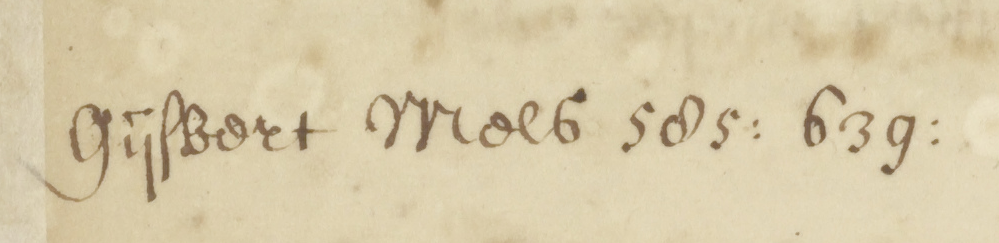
Gijsbert Mels 585: 639:
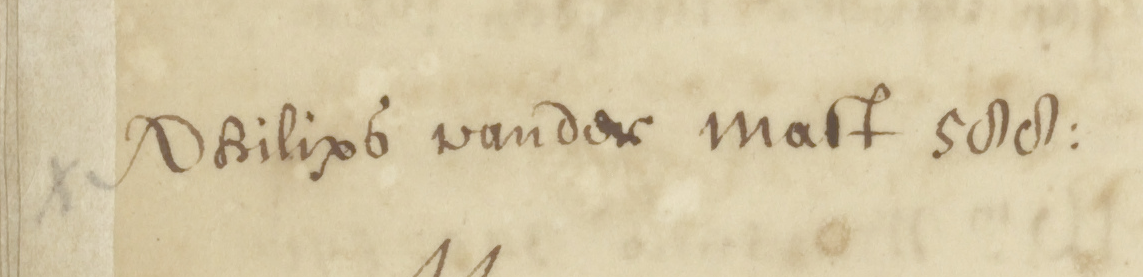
Philips vander Mast 588:
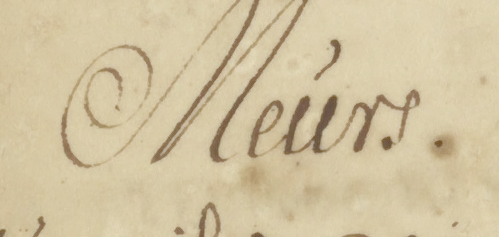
Meurs.
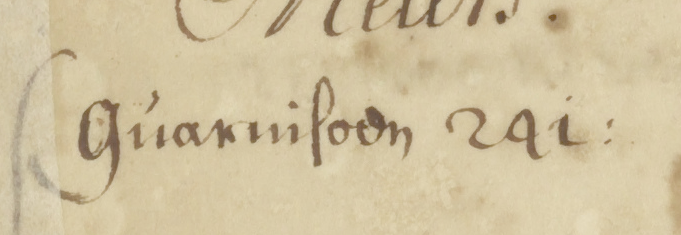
Guarnisoen 241:
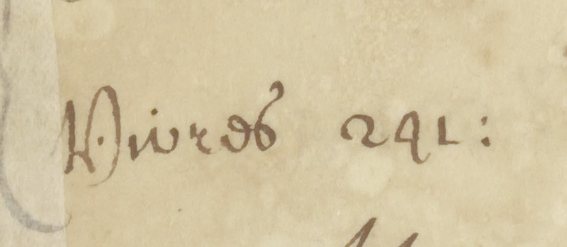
Vivres 241:
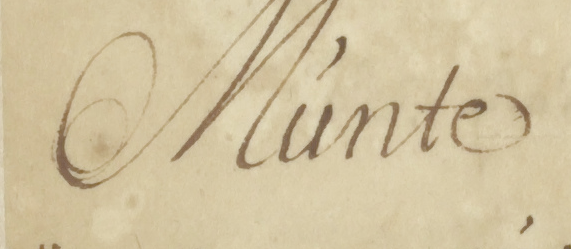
Munte
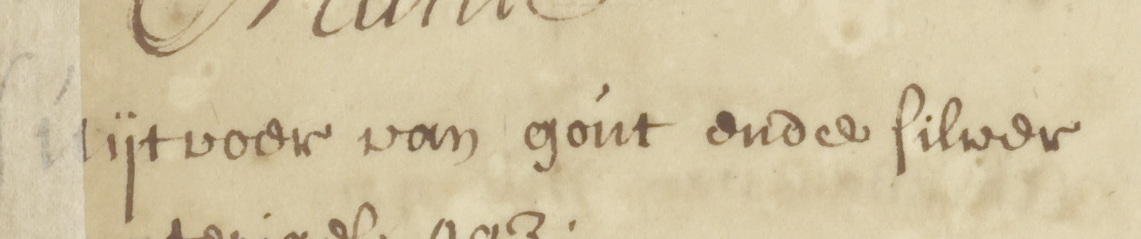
Uijtvoer van gout ende silver
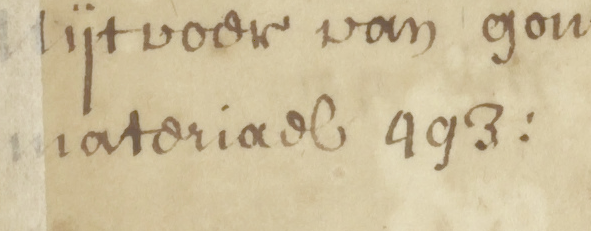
materiael 493:
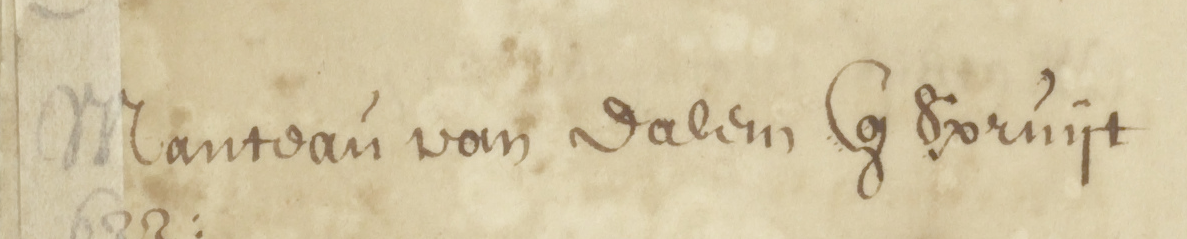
Manteau van Dalem Ca. Spruijt
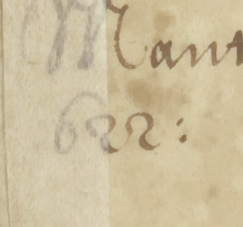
622:
